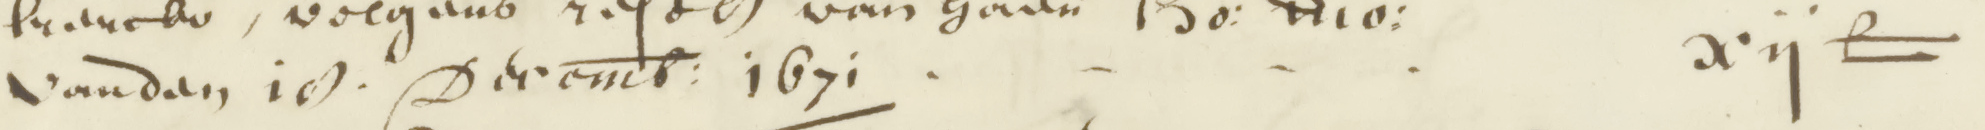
vanden 18: Decemb: 1671 . . . . xij L
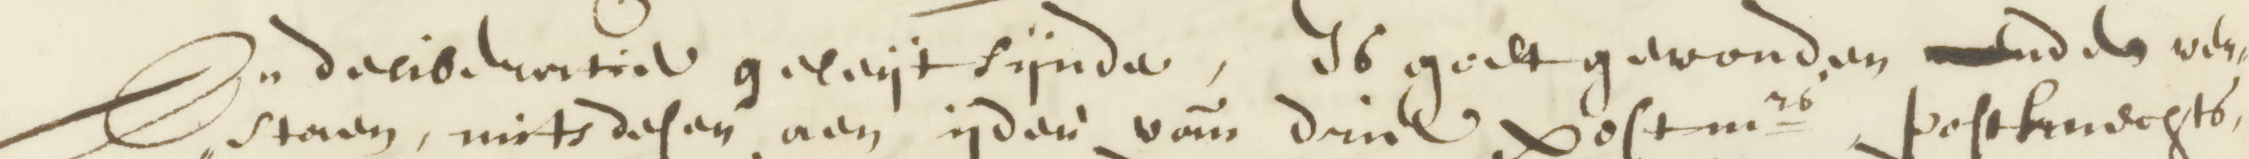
In deliberatie geleijt sijnde, Is goetgevonden ende ver„
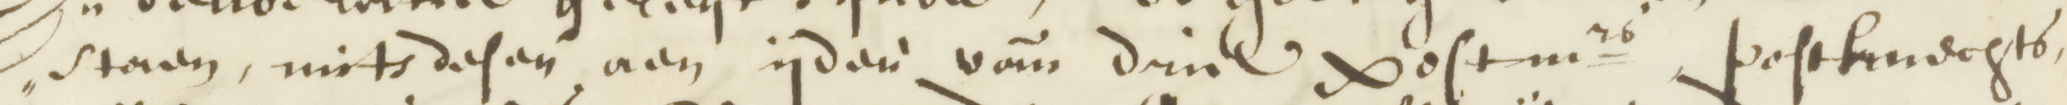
,,staen, mitsdesen aen ijder van drie Postmrs. Postknechts,
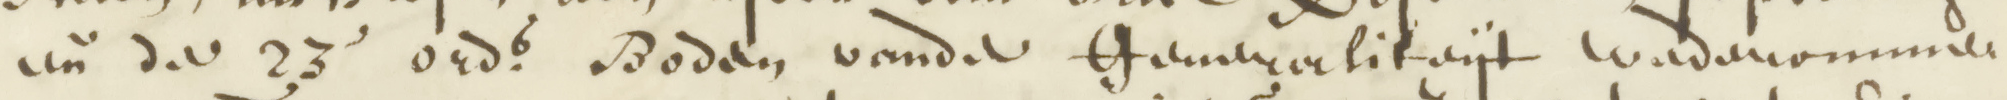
en de 23' ords. Boden vande Generaliteijt wederomme
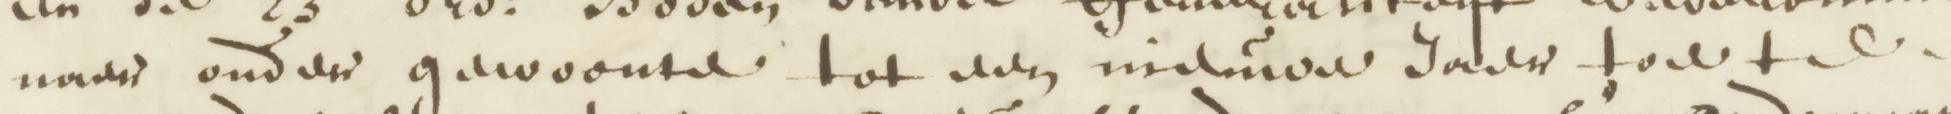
naer ouder gewoonte tot een nieuwe Jaer toe te
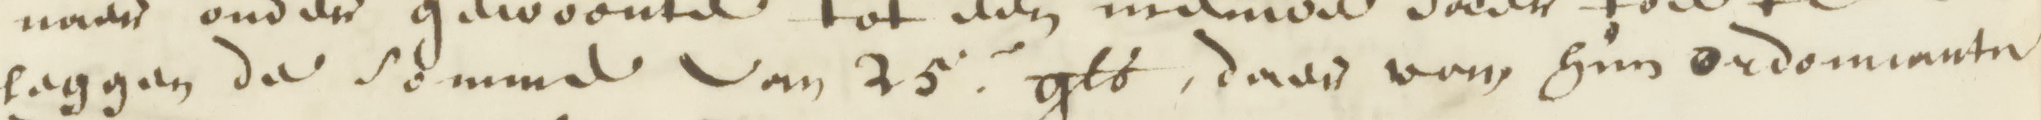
leggen de somme van 25.' gls, daer van hun ordonnantie
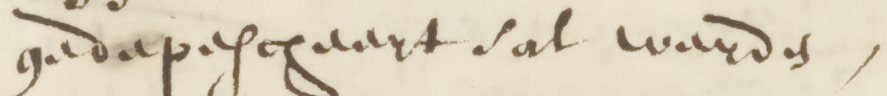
gedepescheert sal werden.
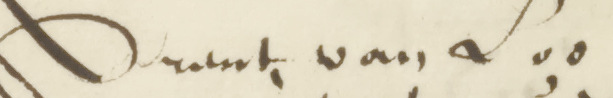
Arent van Loo
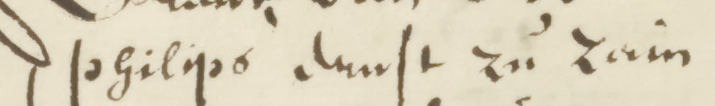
philips enst zu Zain
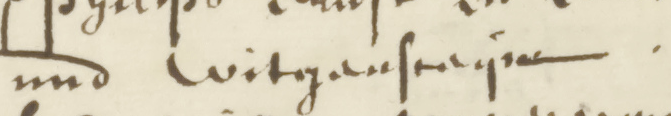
und Witgensteijn.
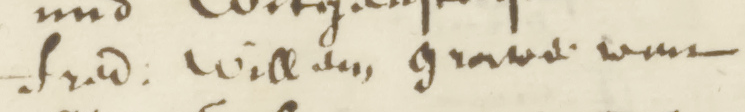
fred: Willem grave van
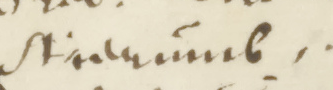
stierumb.
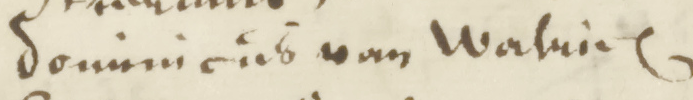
dominicus van Walrich
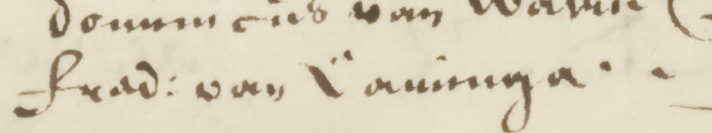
Fred: van Caminga
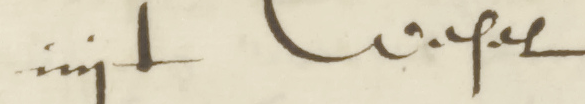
uijt Wesel
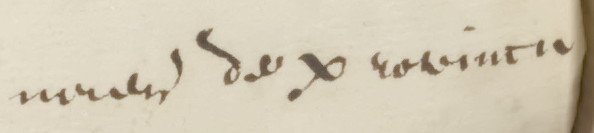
naer de provincie
